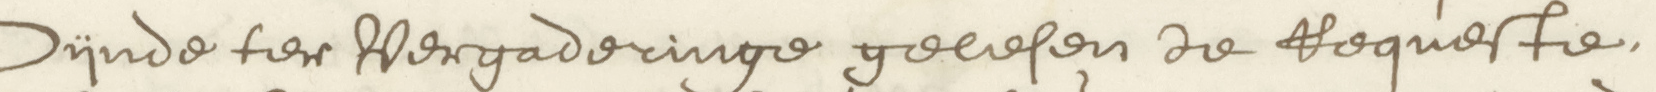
Sijnde ter Vergaderinge gelesen de Requeste
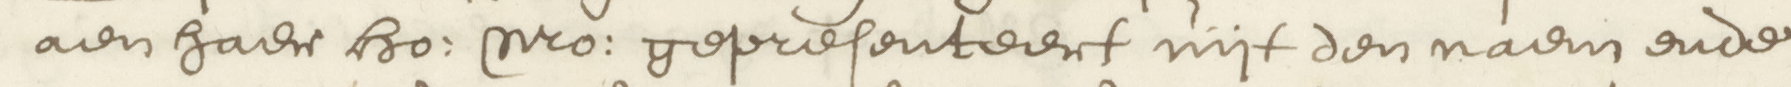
aen haer Ho:Mo: gepresenteert uijt den naem ende
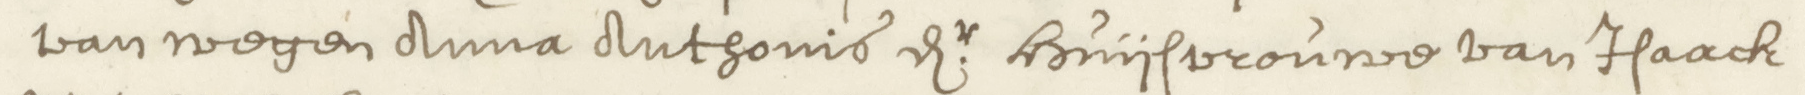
van wegen Anna Anthonisdr. huijsvrouwe van Isaack
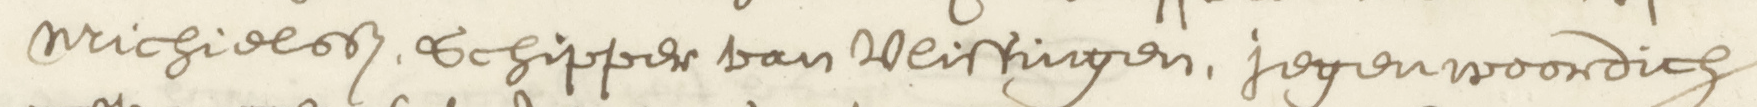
Michielsz, Schipper van Vlissingen, jegenwoordich
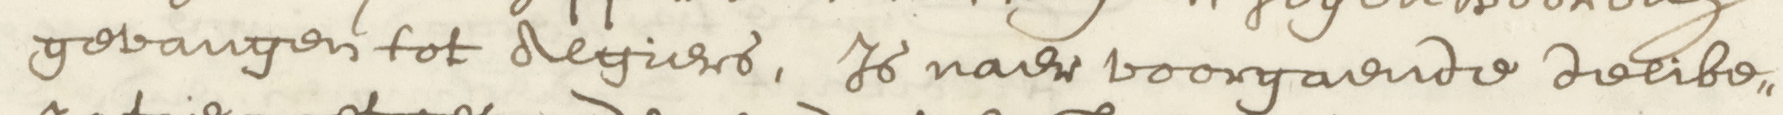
gevangen tot Algiers, Is naer voorgaende delibe,,
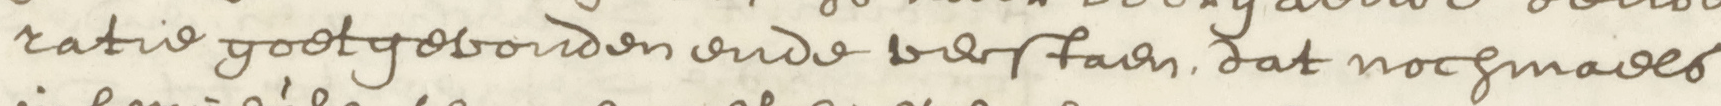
ratie goetgevonden ende verstaen, dat nochmaels
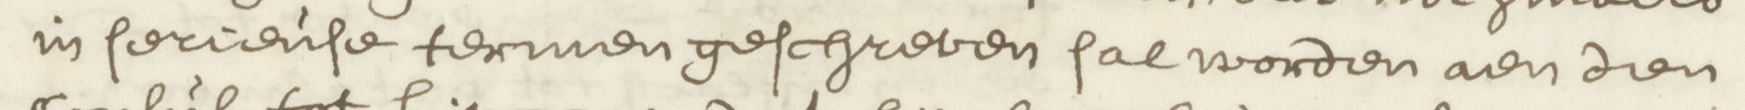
in serieuse termen geschreven sal worden aen den
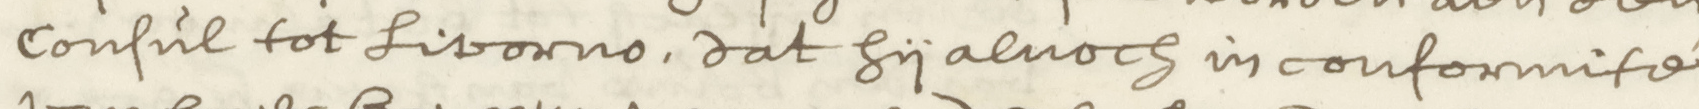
Consul tot Livorno, dat hij alnoch in conformité
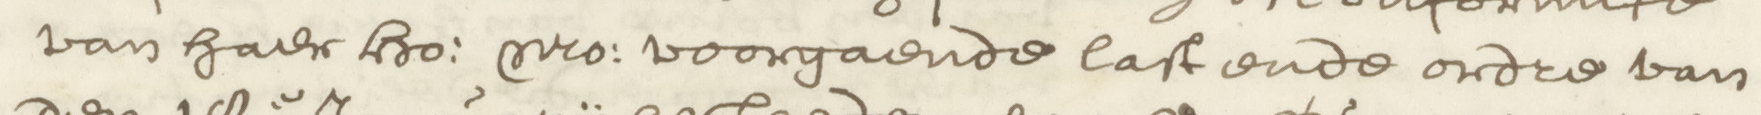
van haer Ho:Mo: voorgaende last ende ordre van
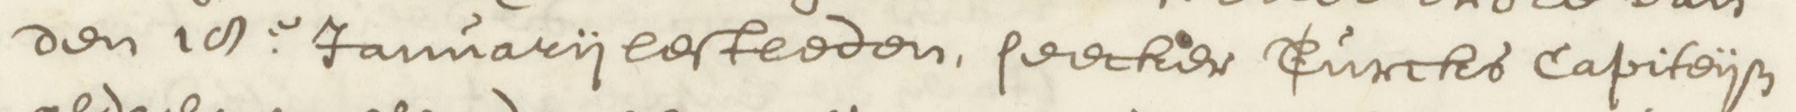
den 18e. Januarij lestleden, seecker Turcks Capiteijn
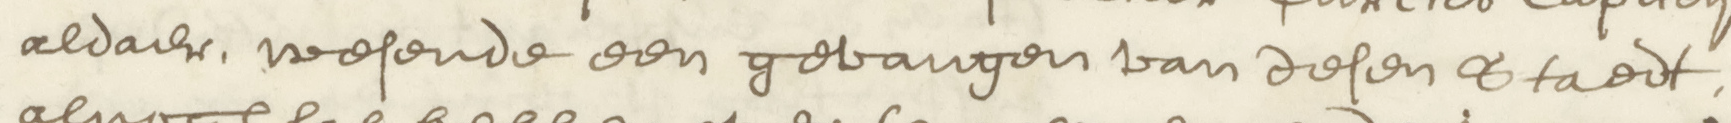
aldaer, wesende een gevangen van desen Staedt
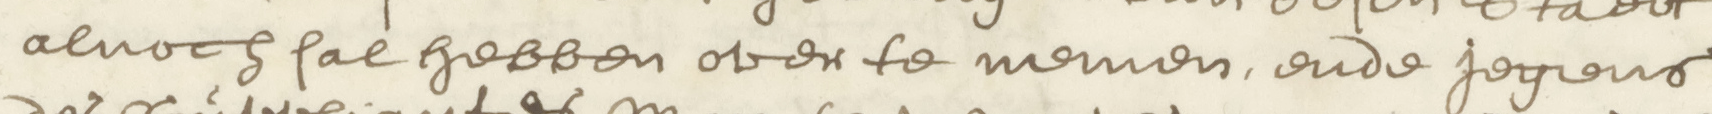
alnoch sal hebben over te nemen, ende jegens
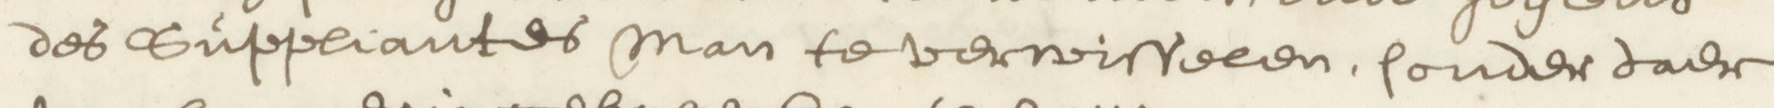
des Suppliantes man te verwisselen, sonder daer
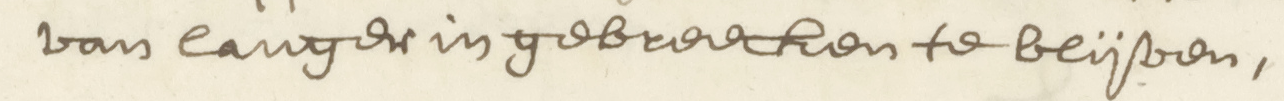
van langer in gebreecken te blijven,
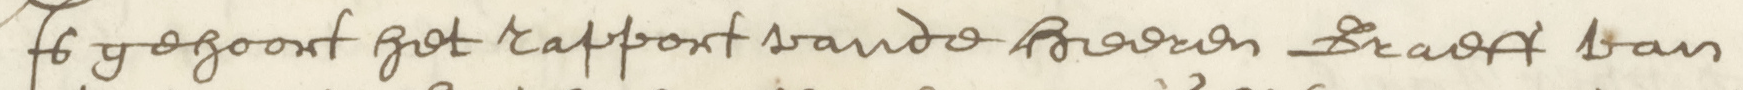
Is gehoort het rapport vande Heeren Graeff van
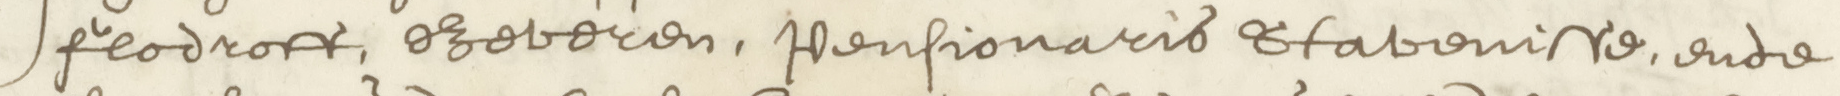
Flodroff, Beveren, Pensionaris Stavenisse, ende
